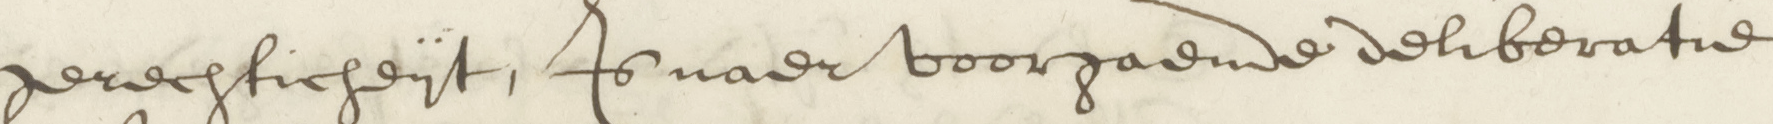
gerechticheijt, Is naer voorgaende deliberatie
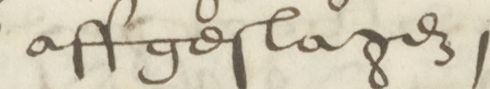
affgeslagen.
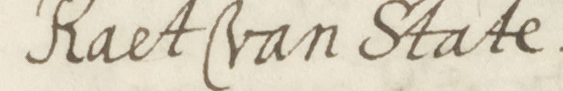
Raet van State
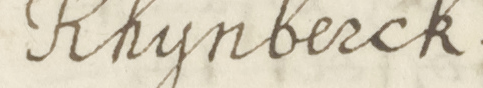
Rhijnberck
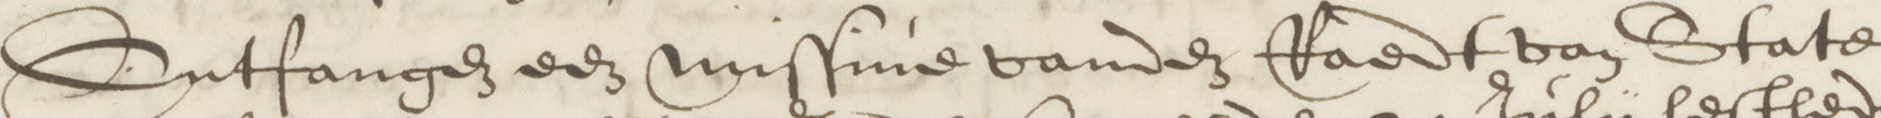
Ontfangen een missive vanden Raedt van State
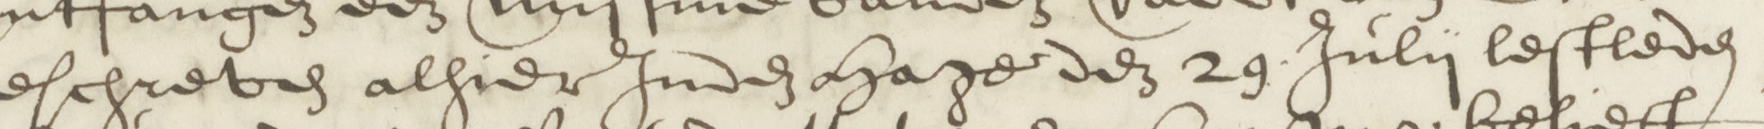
geschreven alhier Inden Hage den 29 Julij lestleden,
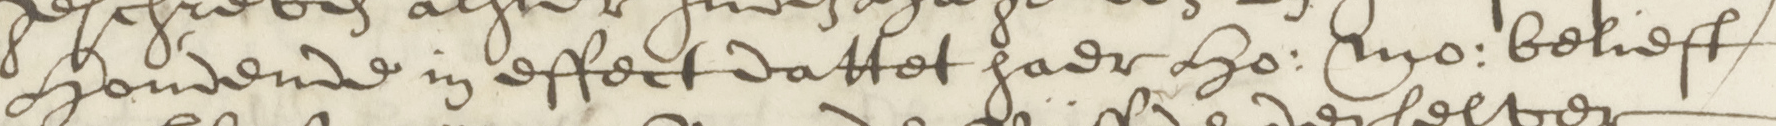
houdende in effect datte haer Ho:Mo: belieft
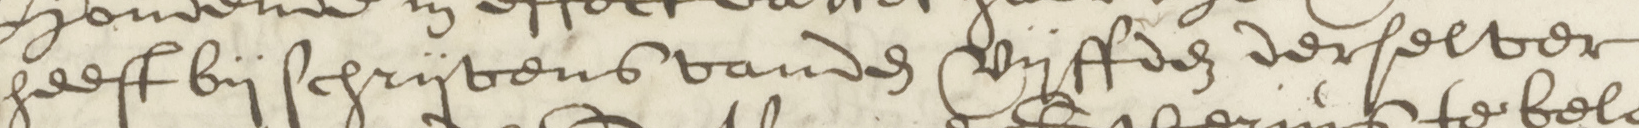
heeft bij schrijvens vanden Vijffden derselver
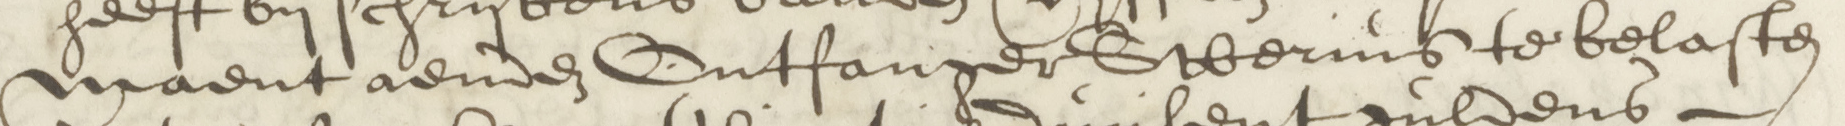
maent aenden Ontfanger Swerius te belasten
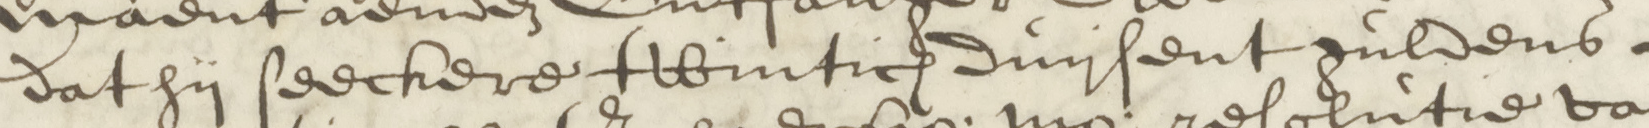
dat hij seeckere twintich duijsent guldens
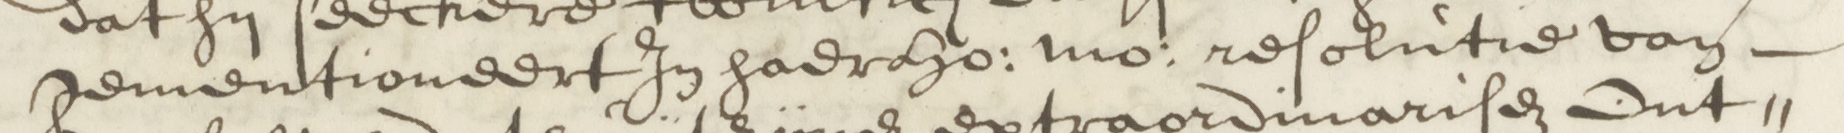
gementioneert in haer Ho:Mo: resolutie van —
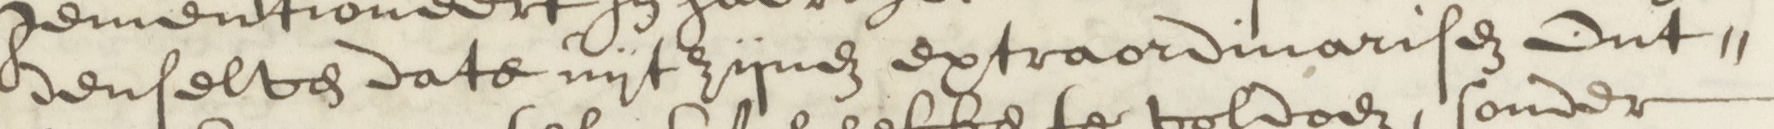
denselven date uijt zijnen extraordinarisen Ont„
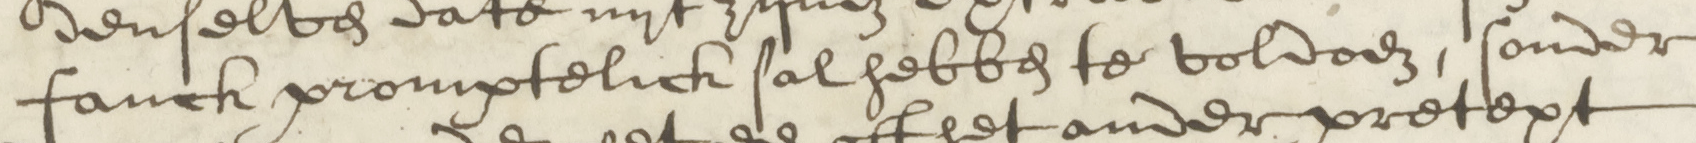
fanck promptelick sal hebben te voldoen, sonder
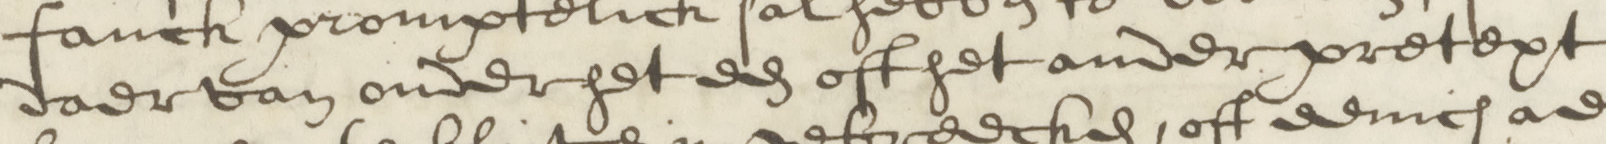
daer van onder het een oft het ander pretext
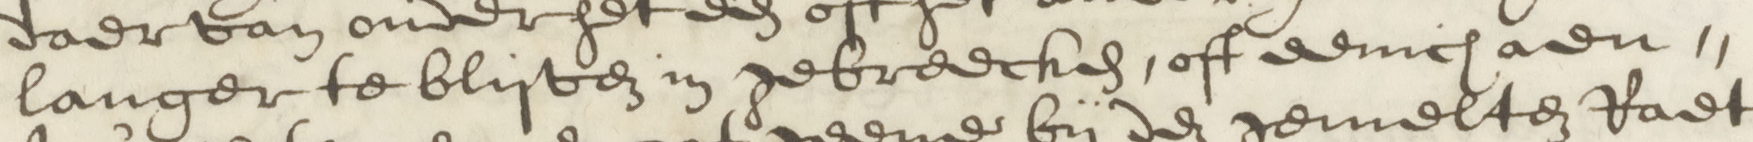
langer te blijen in gebreecken, oft eenich aen„
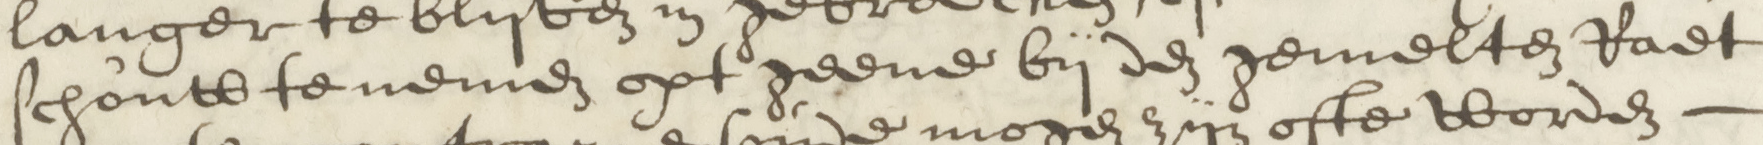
schouw te nemen opt geene bij den gemelten Raet
